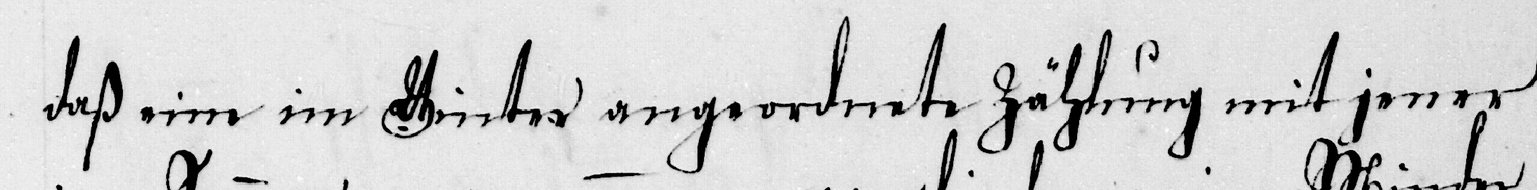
daß eine im Winter angeordnete Zählung mit jener
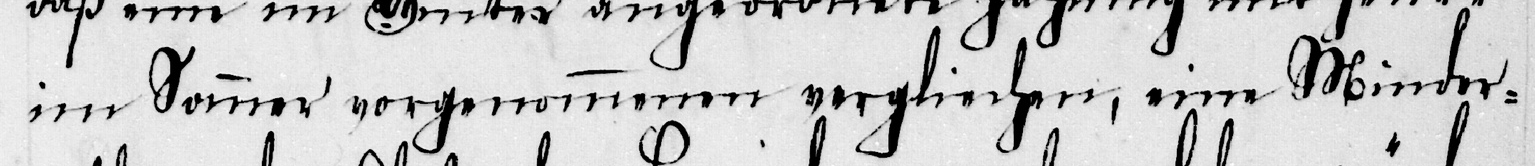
im Sommer vorgenommenen verglichen, eine Minder¬
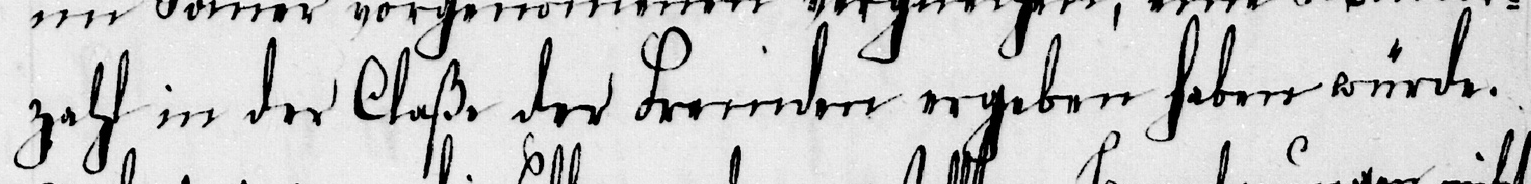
zahl in der Claße der Fremden ergeben haben würde.
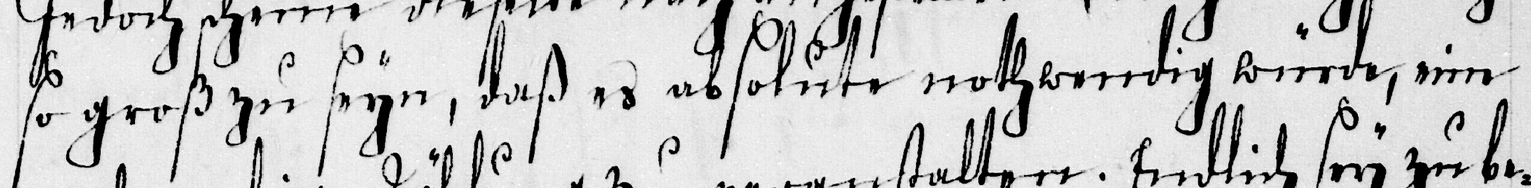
so groß zu seyn, daß es absolute nothwendig würde, eine
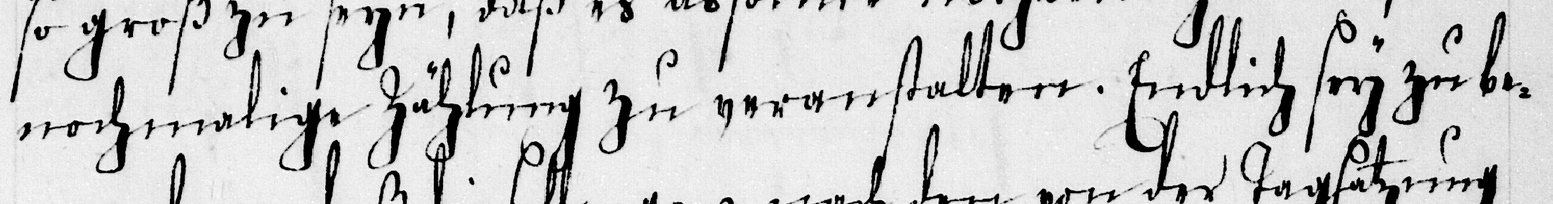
nochmalige Zählung zu veranstalten. Endlich sey zu be¬
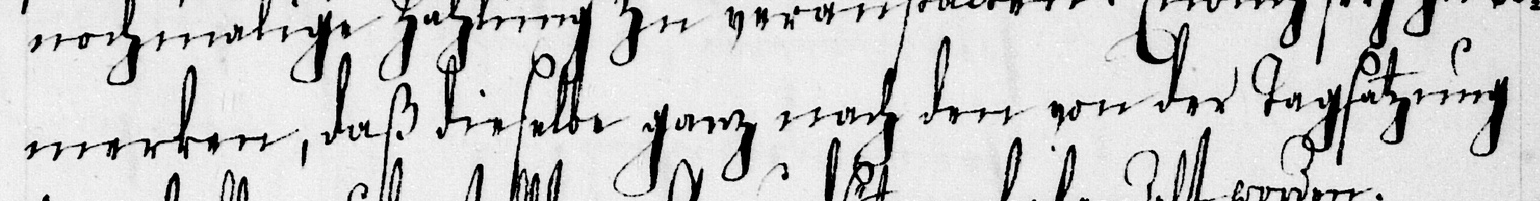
merken, daß dieselbe ganz nach den von der Tagsatzung
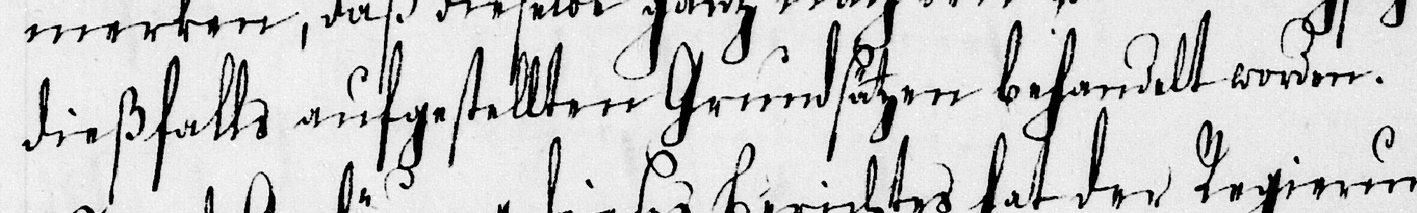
dießfalls aufgestellten Grundsätzen behandelt worden.
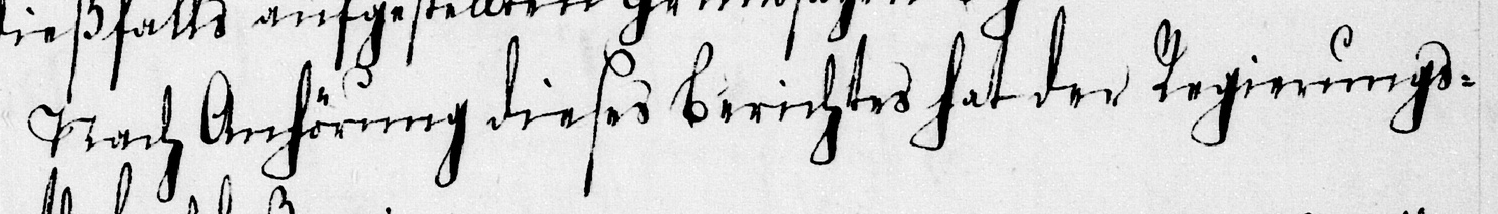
Nach Anhörung dieses Berichtes hat der Regierungs¬
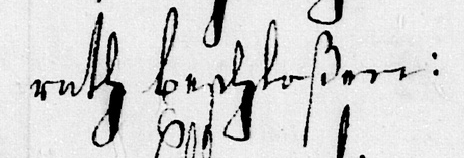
rath beschloßen:
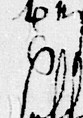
1.)
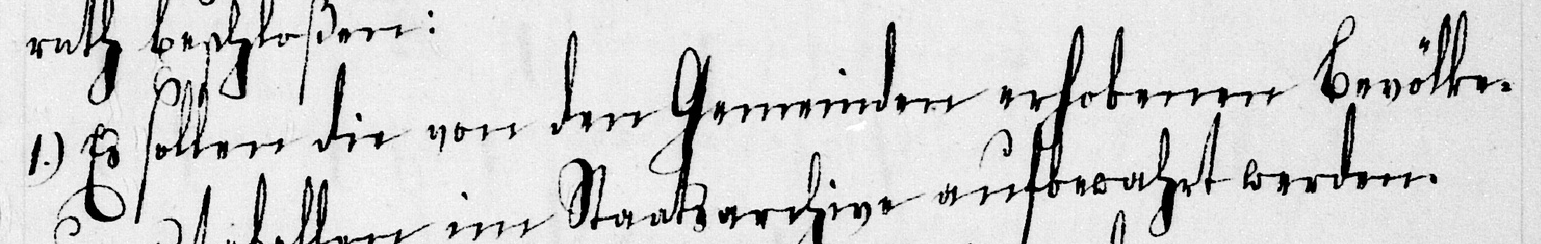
Es sollen die von den Gemeinden erhobenen Bevölke¬
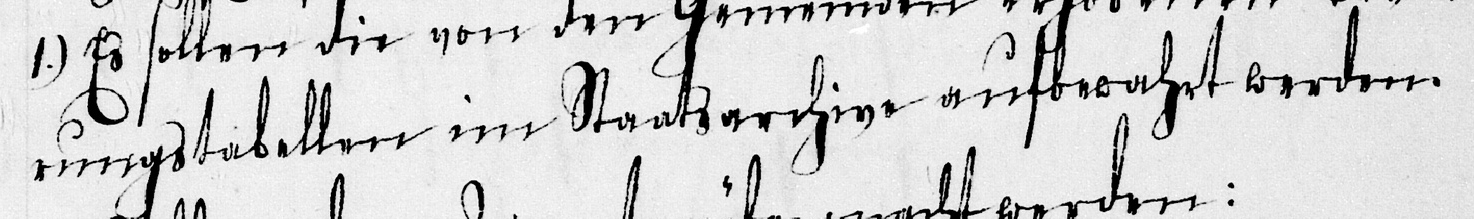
rungstabellen im Staatsarchive aufbewahrt werden.
